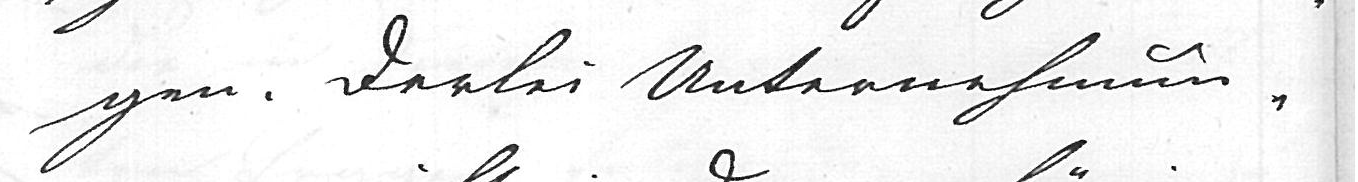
gen. Derlei Unternehmun-
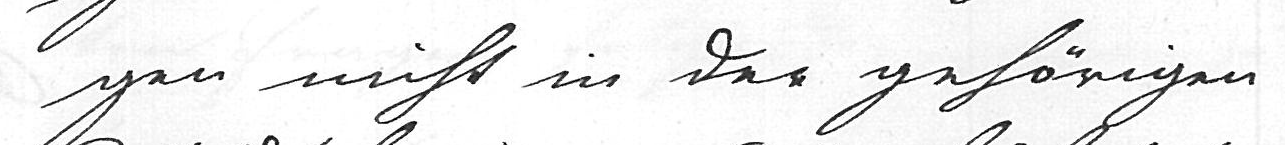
gen nicht in der gehörigen
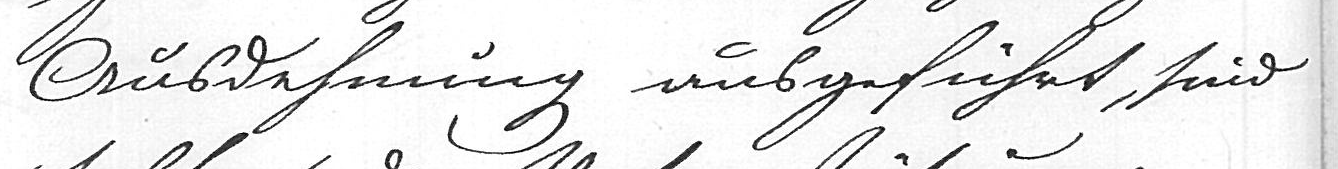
Ausdehnung ausgeführt, sind
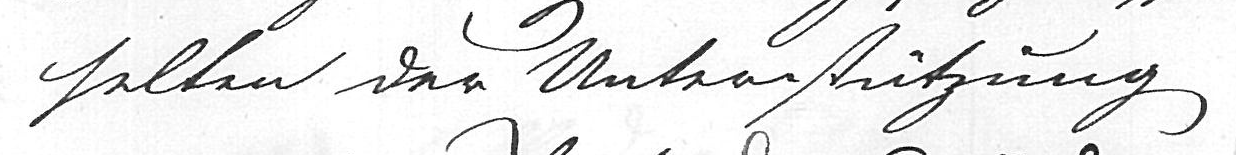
selten der Unterstützung
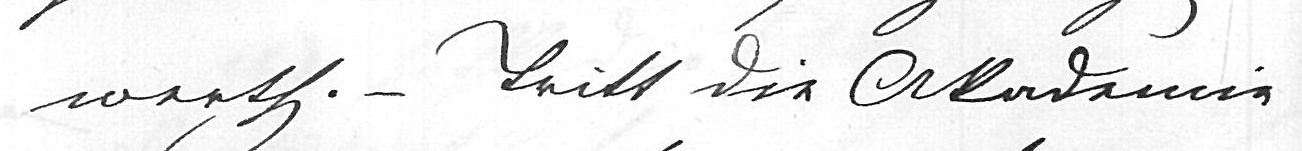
werth.- Tritt die Akademie
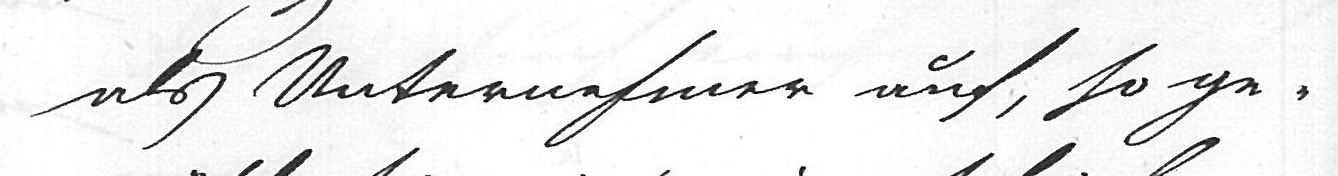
als Unternehmer auf, so ge-
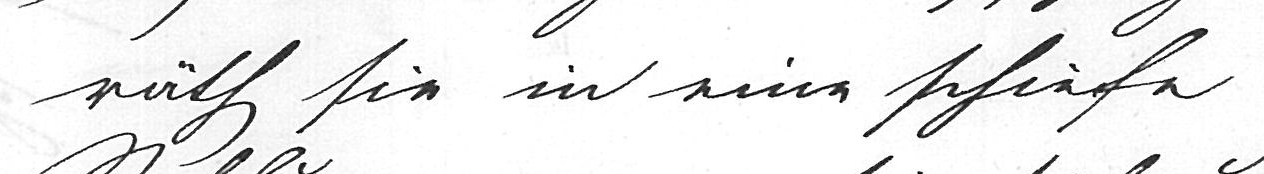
räth sie in eine schiefe
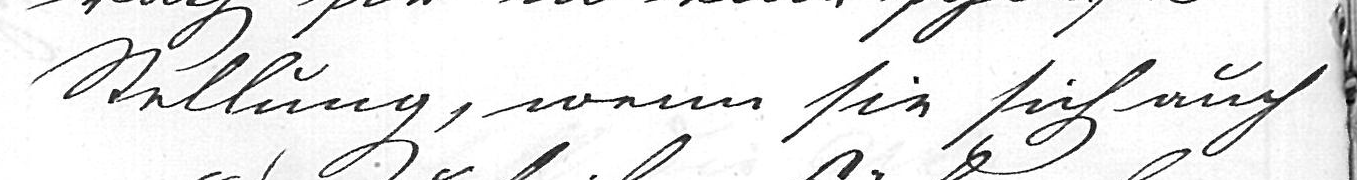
Stellung, wenn sie sich auch
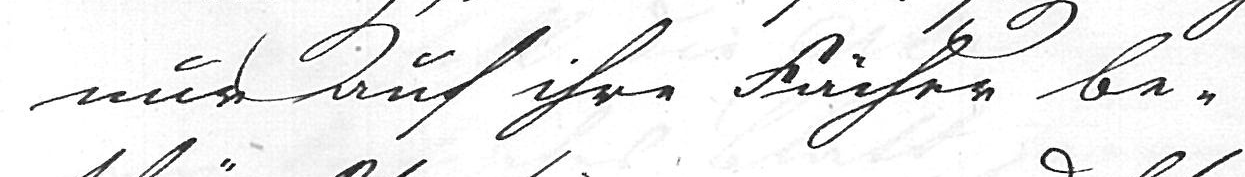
nur auf ihre Bücher be-
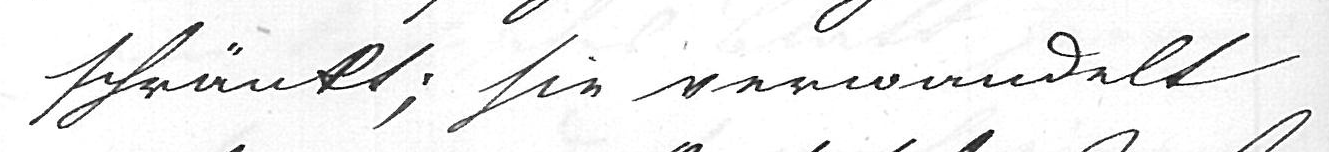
schränkt; sie verwandelt
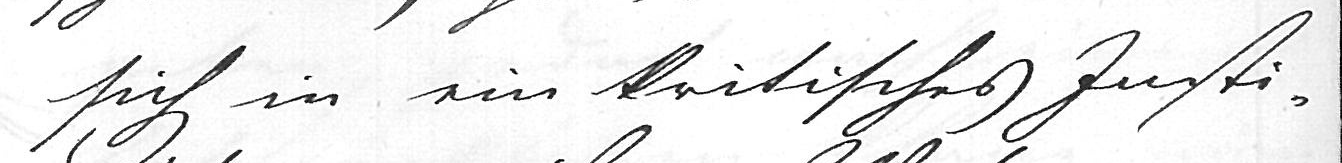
sich in ein kritisches Insti-
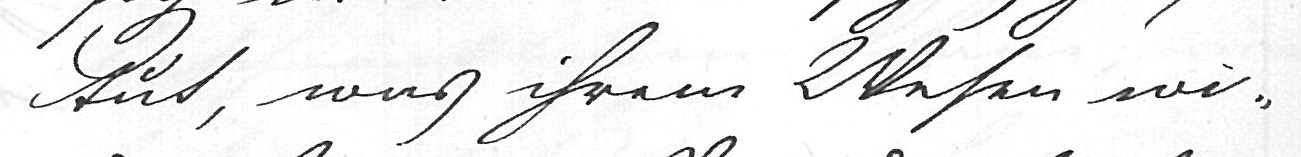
tut, was ihrem Wesen wi-
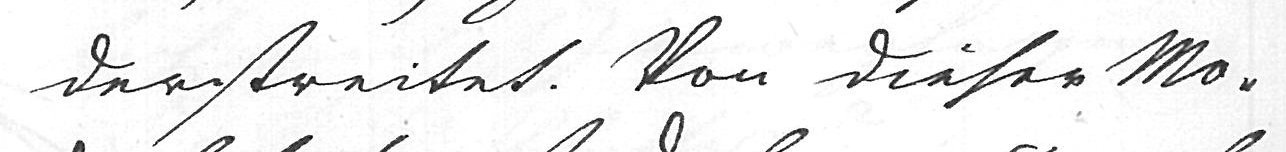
derstreitet. Von dieser Mo-
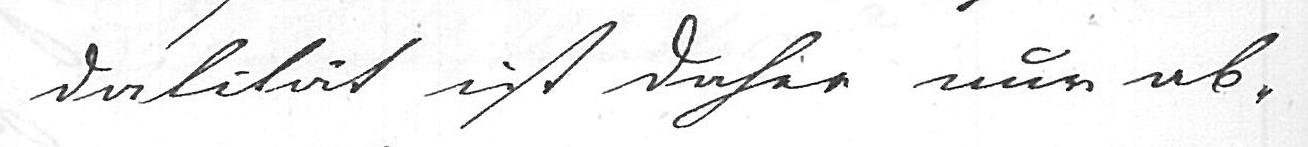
dalität ist daher nur ab-
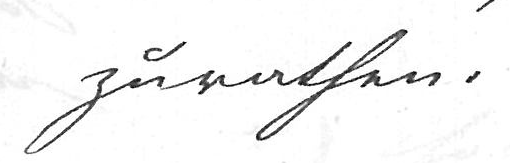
zurathen.
